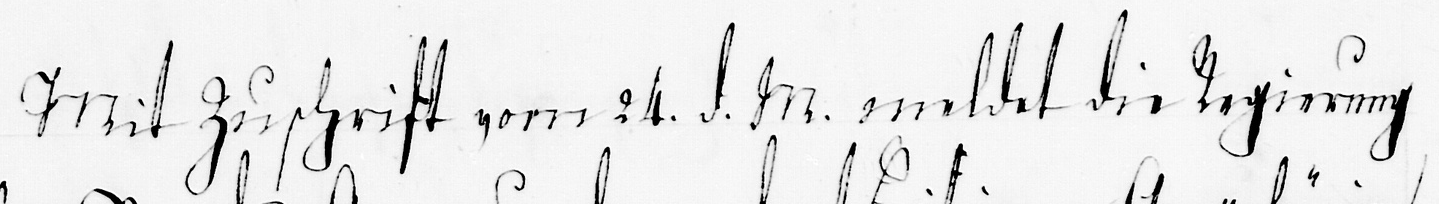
Mit Zuschrift vom 24. d. M. meldet die Regierung
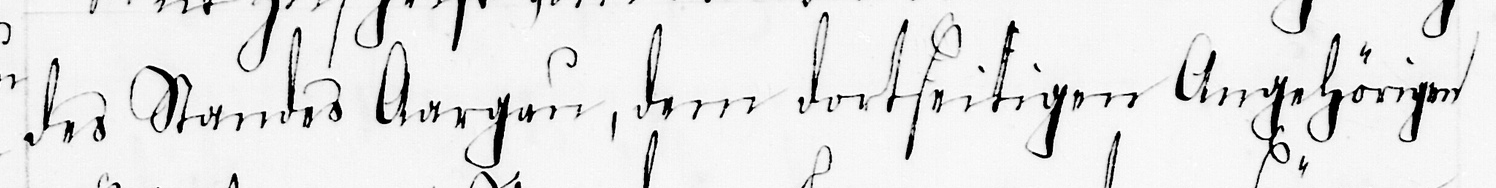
des Standes Aargau, dem dortseitigen Angehörigen
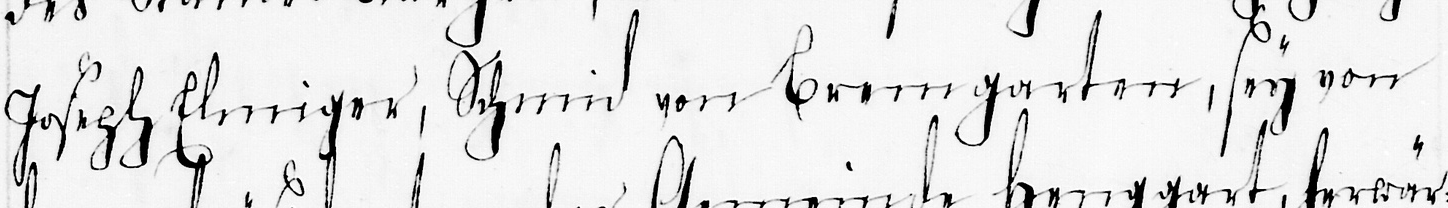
Joseph Elmiger, Schmid von Bremgarten, sey von
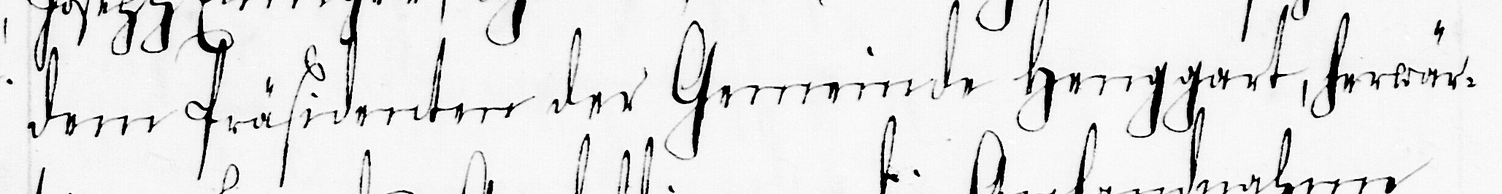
dem Präsidenten der Gemeinde Henggart, herwär¬
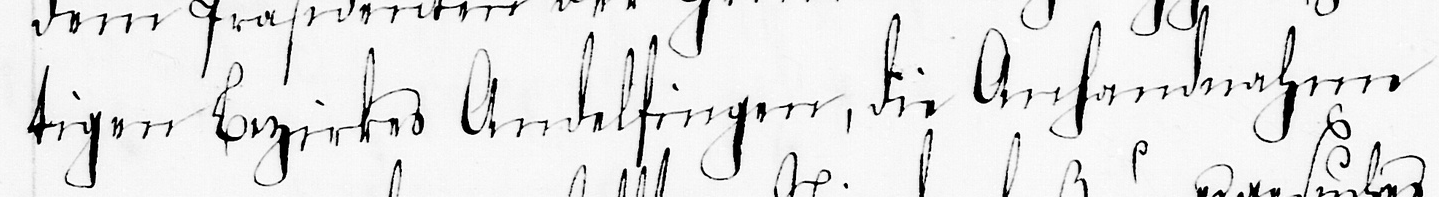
tigen Bezirkes Andelfingen, die Anhandnahme
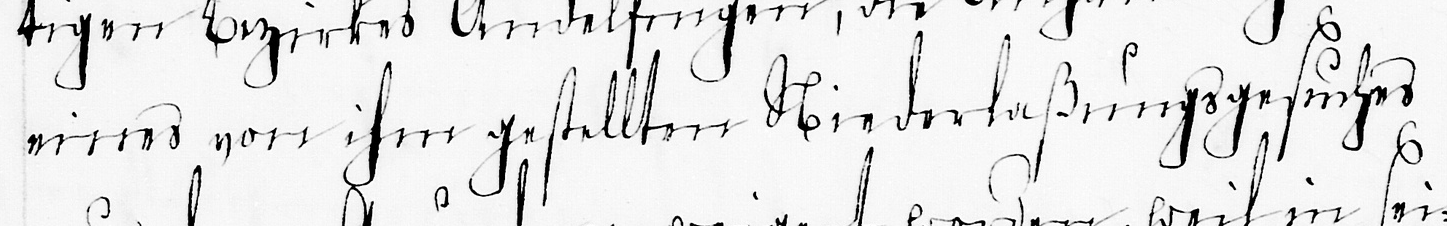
eines von ihm gestellten Niederlaßungsgesuches
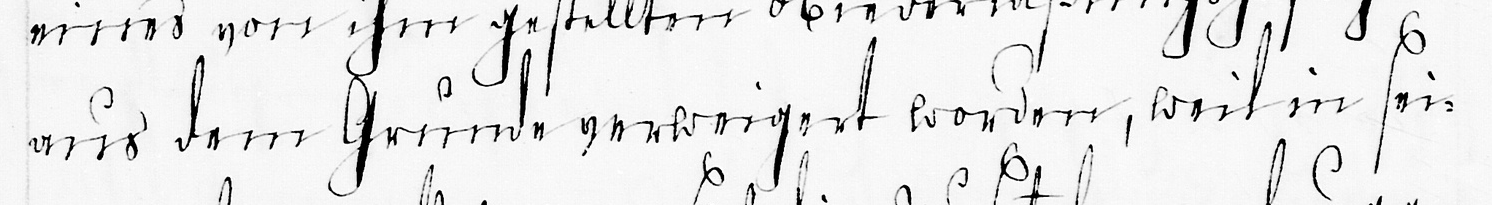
aus dem Grunde verweigert worden, weil in sei¬
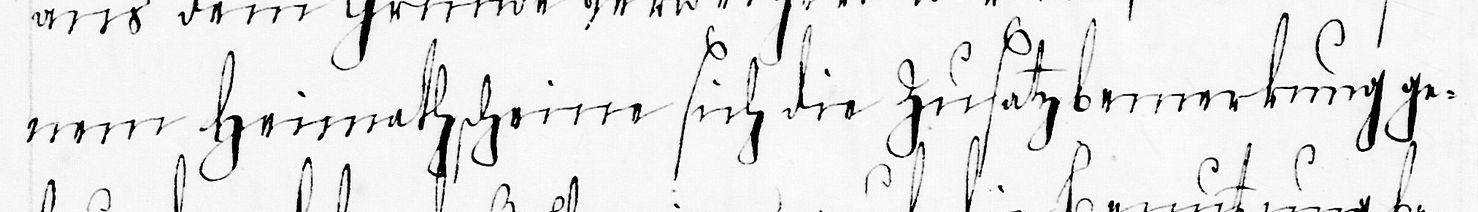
nem Heimathscheine sich die Zusatzbemerkung ge¬
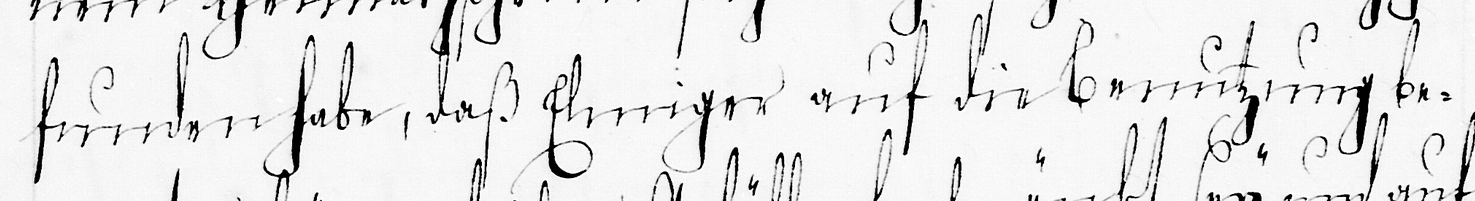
funden habe, daß Elmiger auf die Benutzung be¬
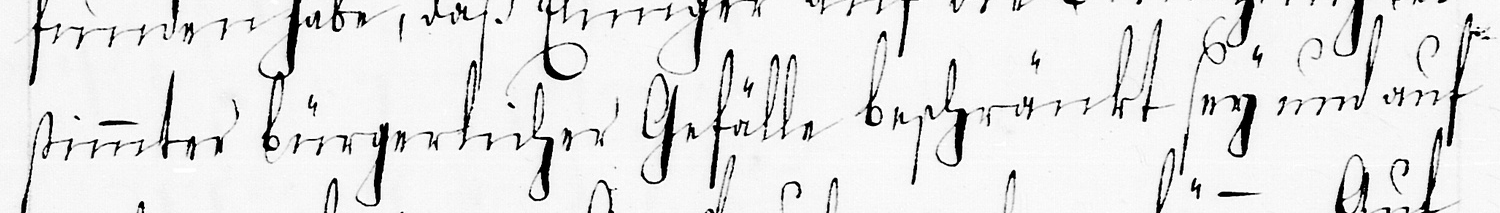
stimmter bürgerlicher Gefälle beschränkt sey und auf
